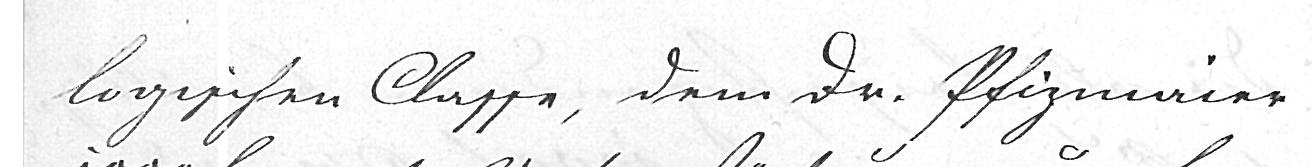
logischen Classe, dem Dr. Pfizmaier
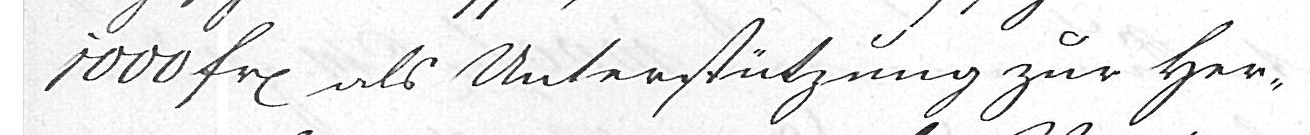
1000 fl als Unterstützung zur Her-
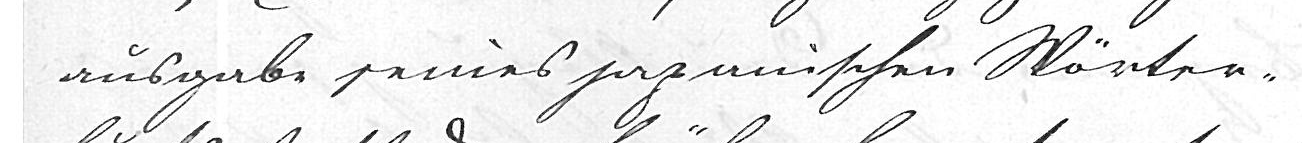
ausgabe seines japanischen Wörter-
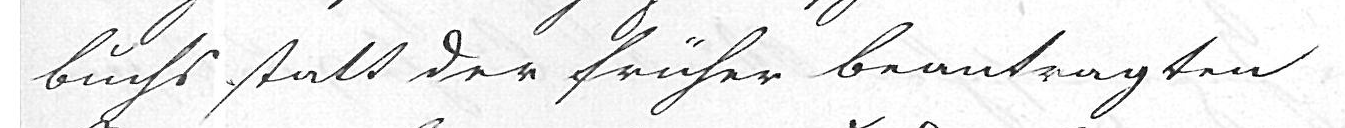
buchs statt der früher beantragten
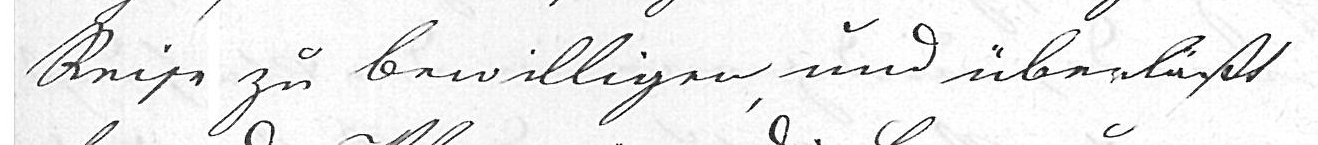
Reise zu bewilligen und überläßt
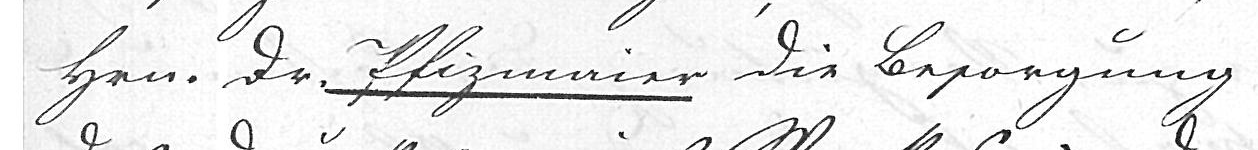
Hrn. Dr. Pfizmaier die Besorgung
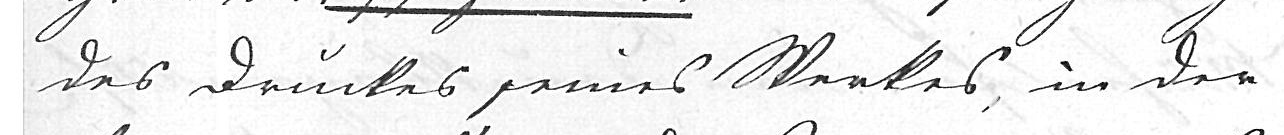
des Druckes seines Werkes, in der
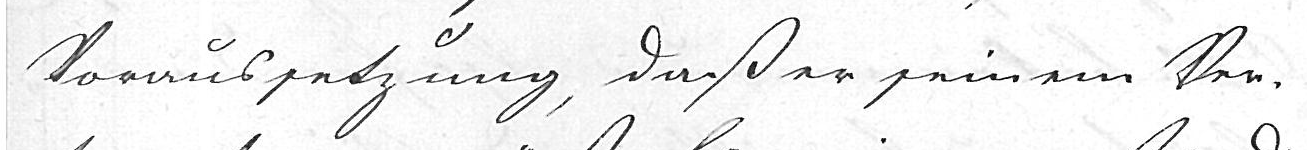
Voraussetzung, daß er seinem Ver-
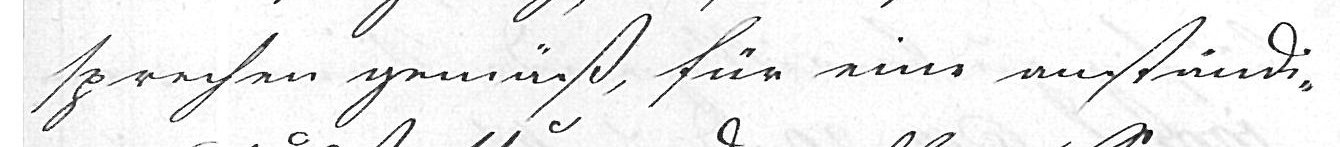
sprechen gemäß, für eine anständ-
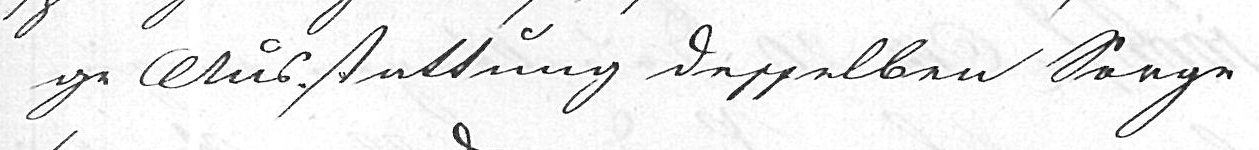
gen Ausstattung desselben Sorge
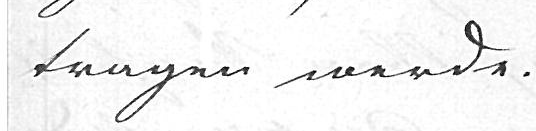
tragen werde.
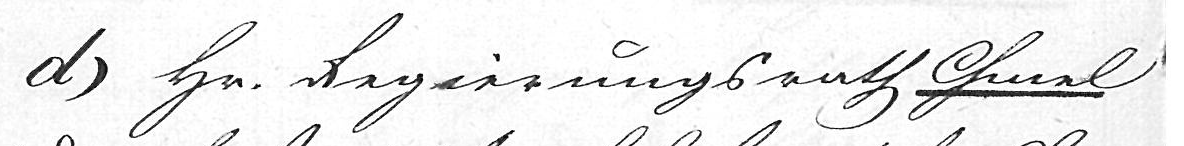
d) Hr. Regierungsrath Chmel
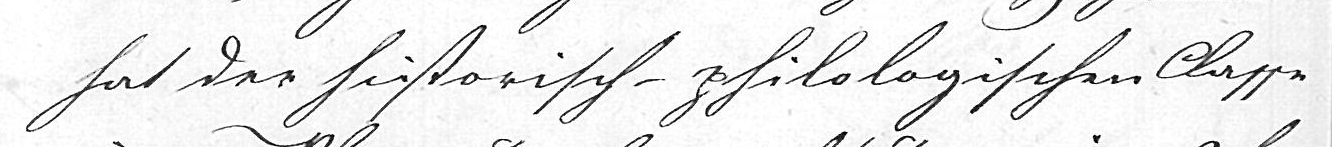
hat der historisch-philologischen Classe
